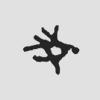寺
